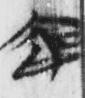竆（躬）
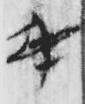身
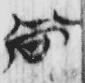尚
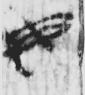母
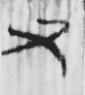又（有）
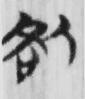咎
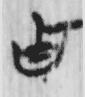占
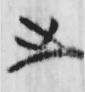之
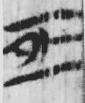亙（恆）
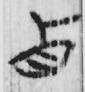貞
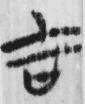吉
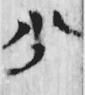少
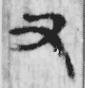又（有）
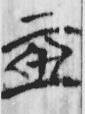亞（惡）
